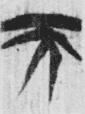天
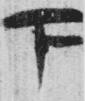下
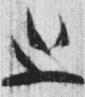之
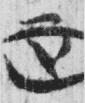正（政）
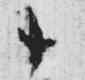十
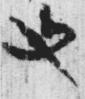又（有）
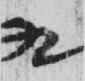九
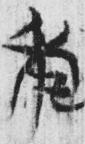年
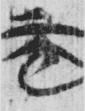而
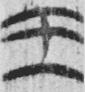王
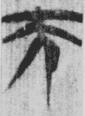天
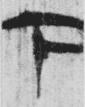下
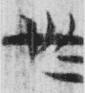十三
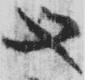又（有）
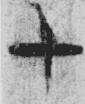七
